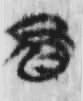冒
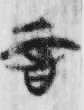言
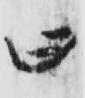曰
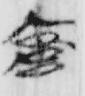舒
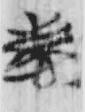慶
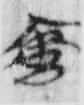舒
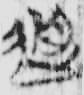舒
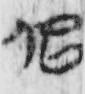卯
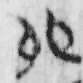卯
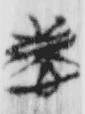慶
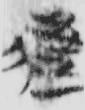逃
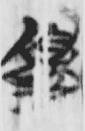○（夏）
